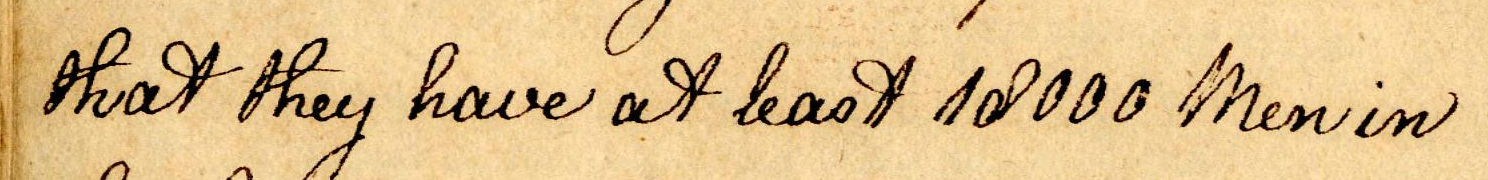that they have at least 18000 Men in
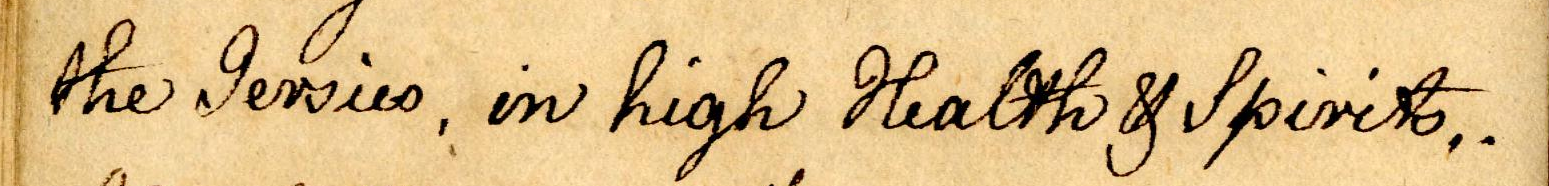the Jersies, in high Health & Spirits.
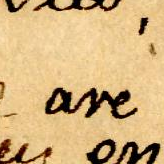are
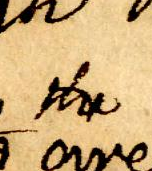the
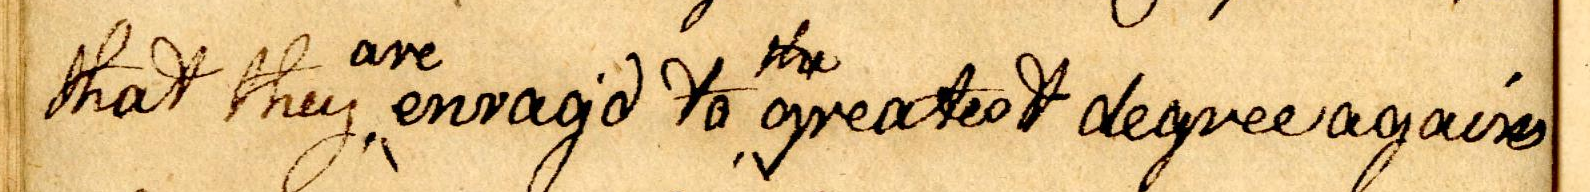that they ^ enrag'd to ^ greatest degree agains
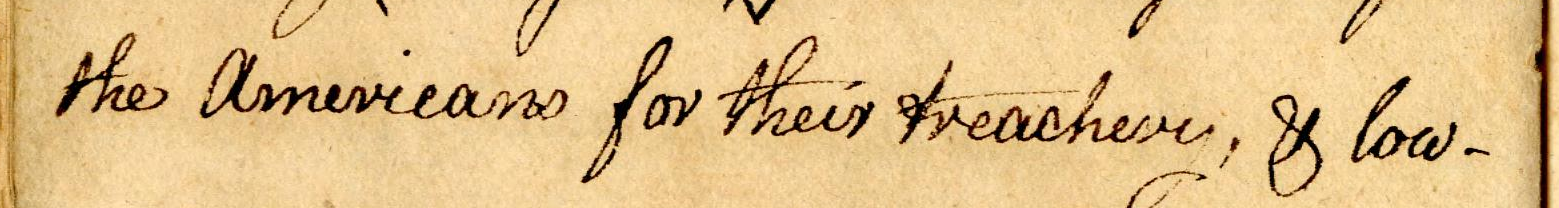the Americans for their treachery, & low-
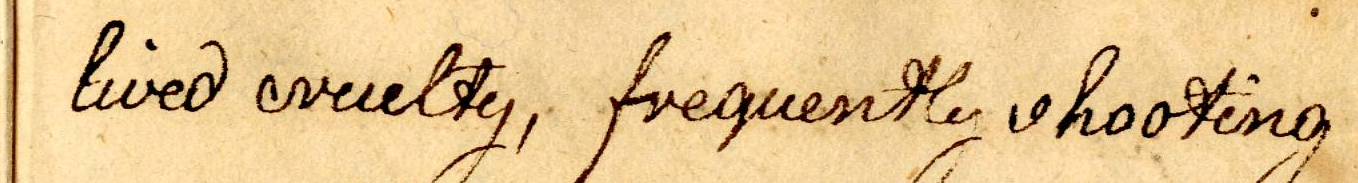lived cruelty, frequently shooting
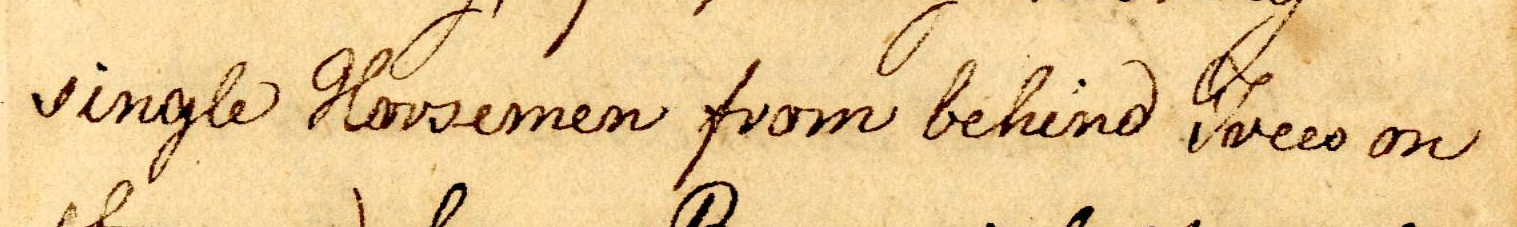single Horsemen from behind Trees on
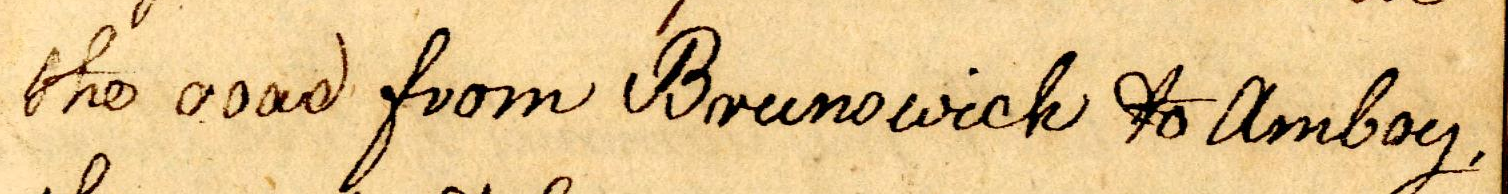the road from Brunswick to Amboy,
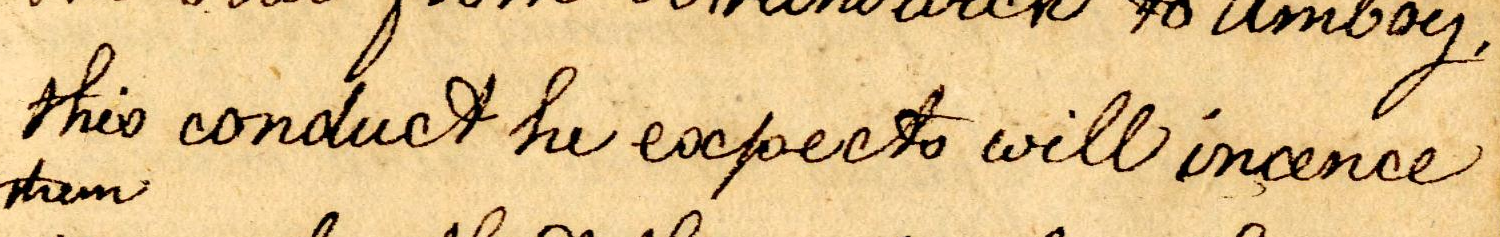this conduct he expects will incence
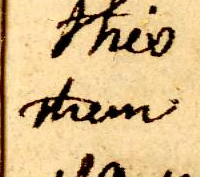them
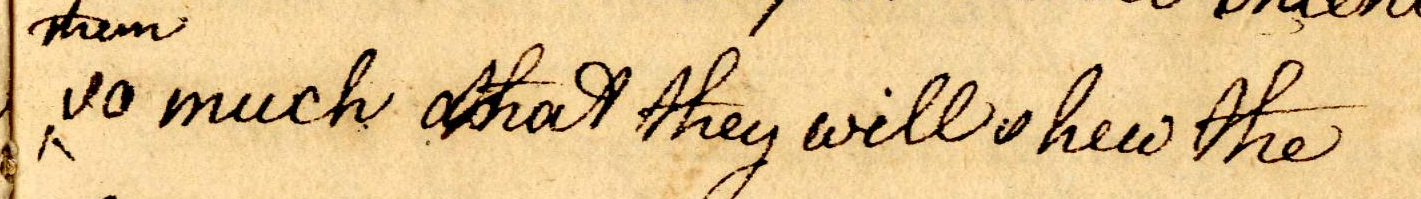^ so much that they will shew the
